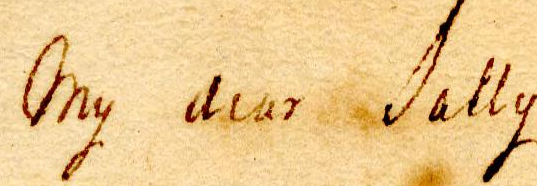Pry dar Sall
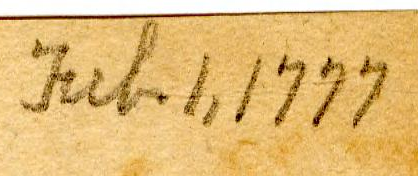hub: 11777
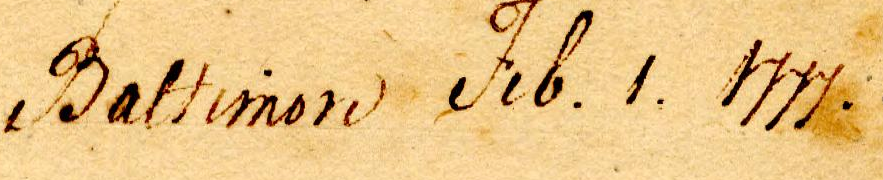Battemon Pib. 1. 1777.
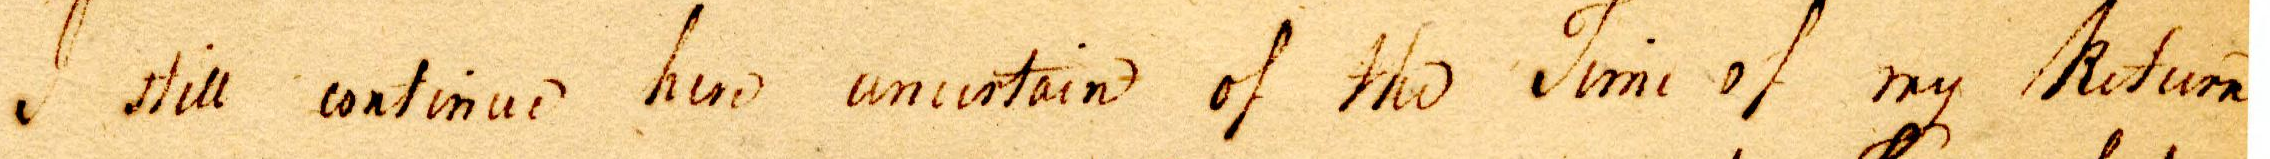stell continue here uncertain of the Time of my Return
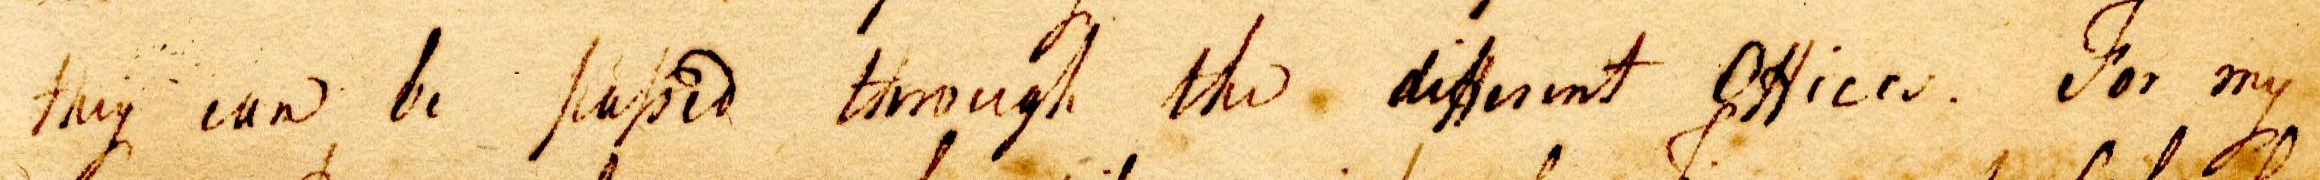tay can be passed trough the different Ofices. For my
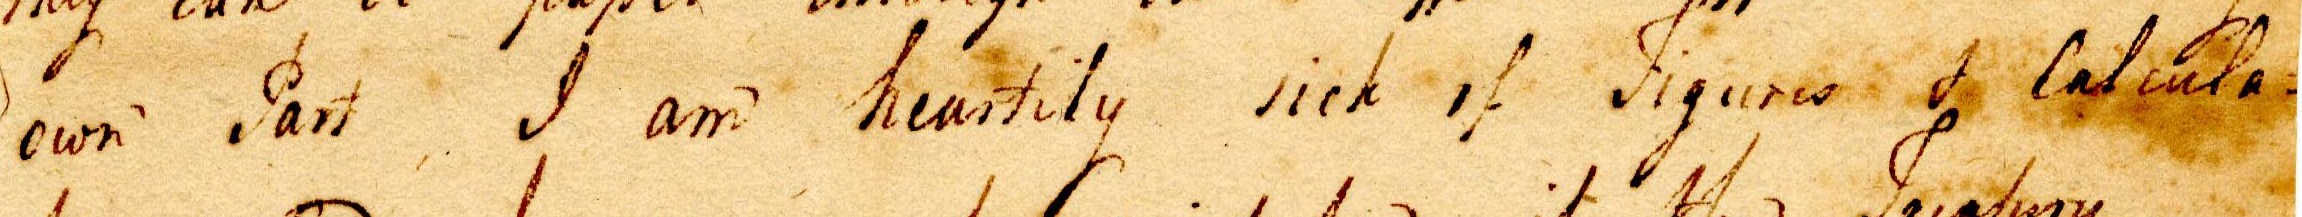own sart I am heartily sick of Riqures & Calcute
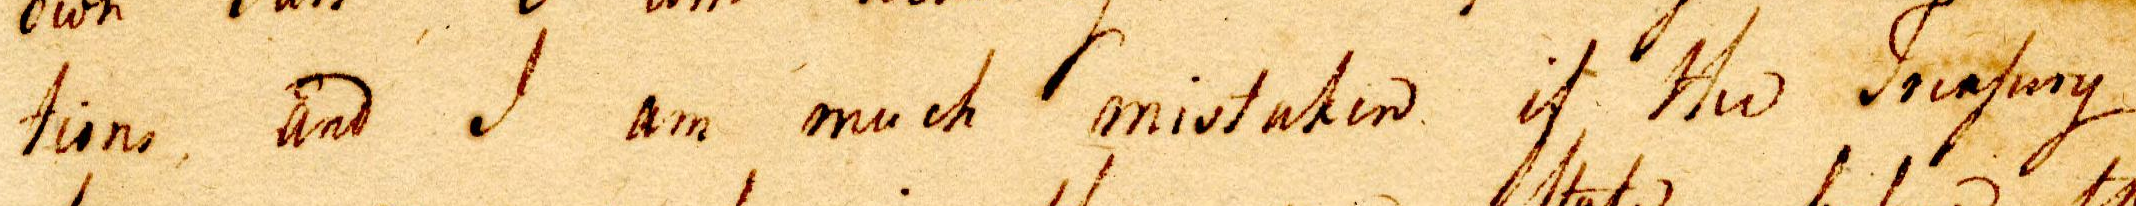tioms, and I am much mistaken if the Ssreapury
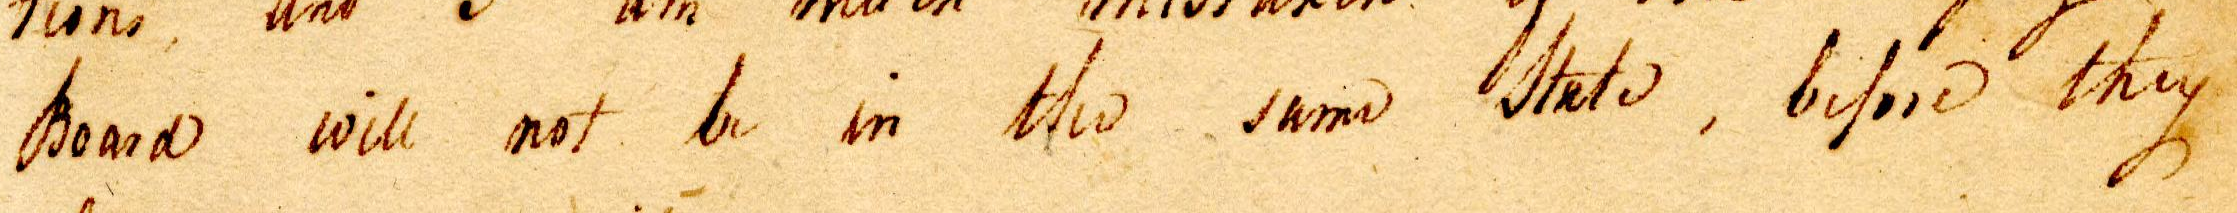Board well not be in the same Sate, before they
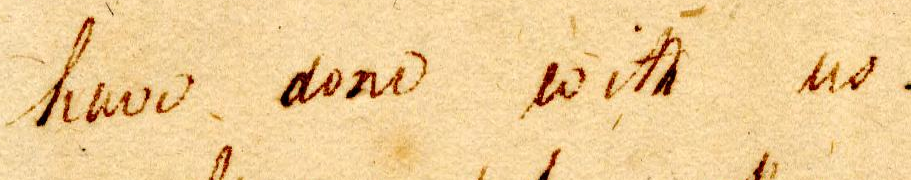have done with s
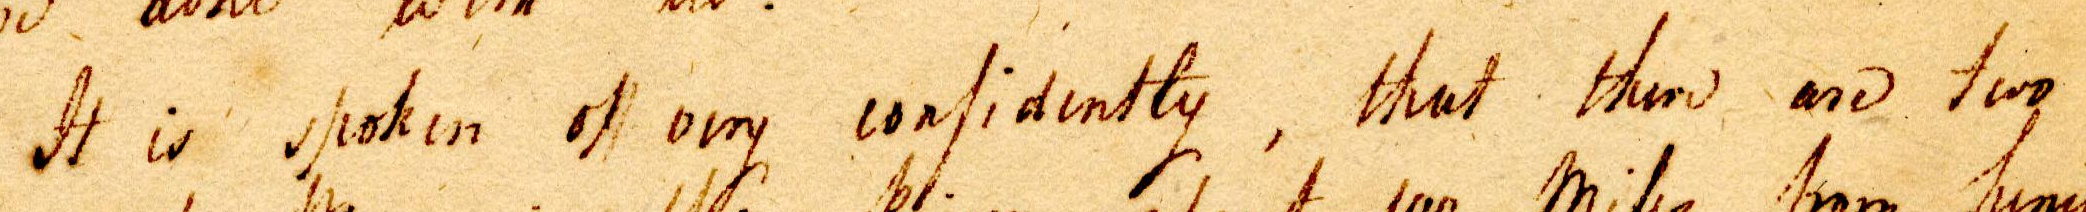It is spoken of orry confidently, that there are tivo
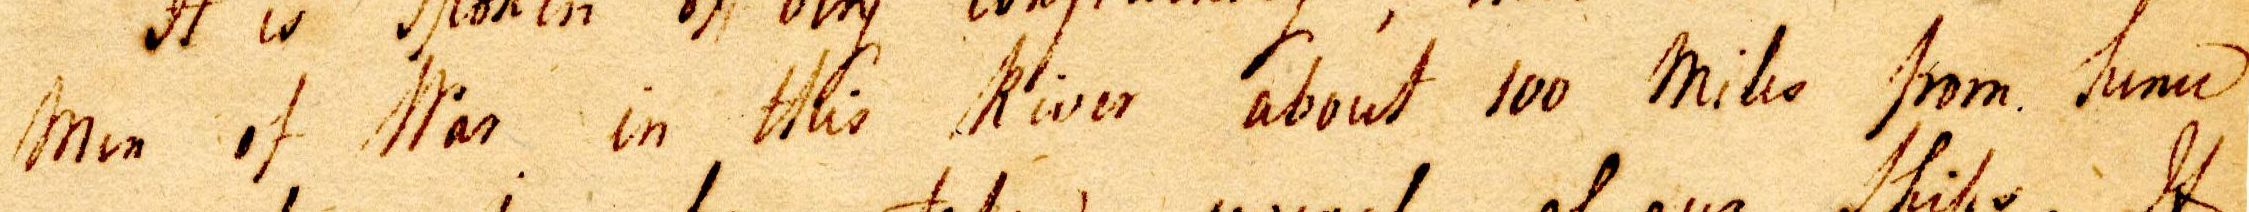Men of War in this Niver about 100 Miles from hence
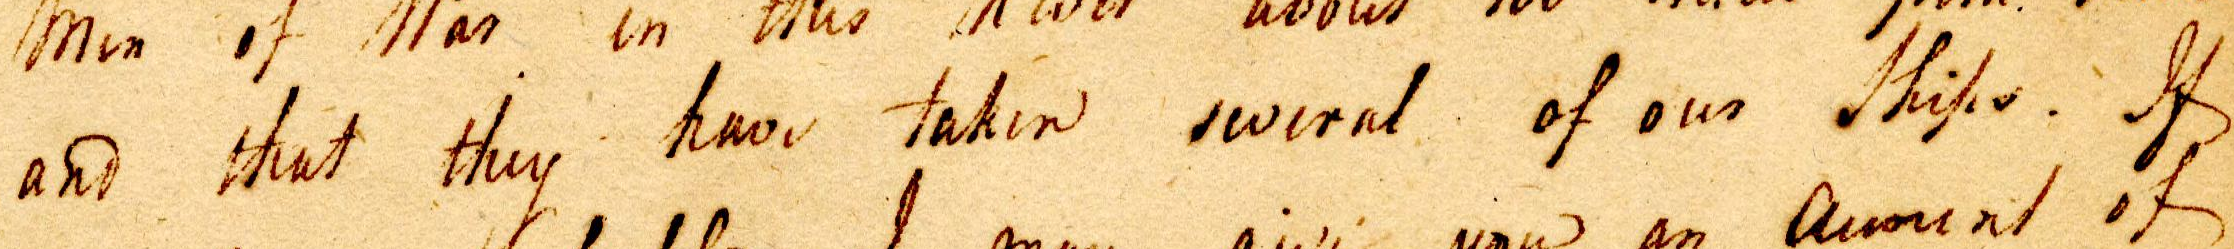and that they have taken sweral of our Ships. If
